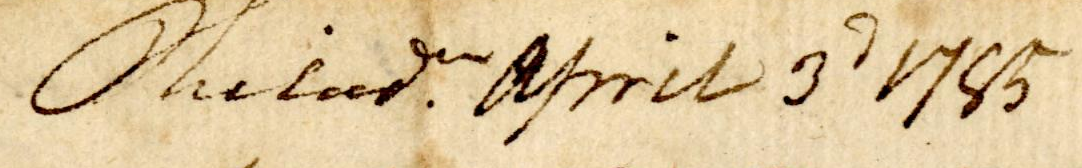Philad^a. April 3^d 1785
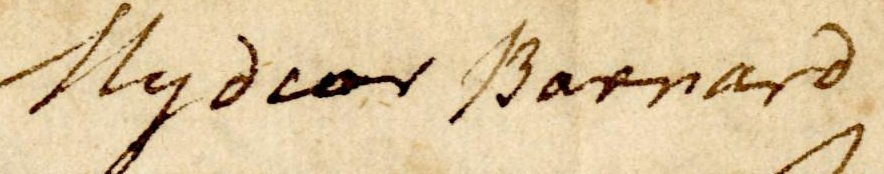My dear Barnard
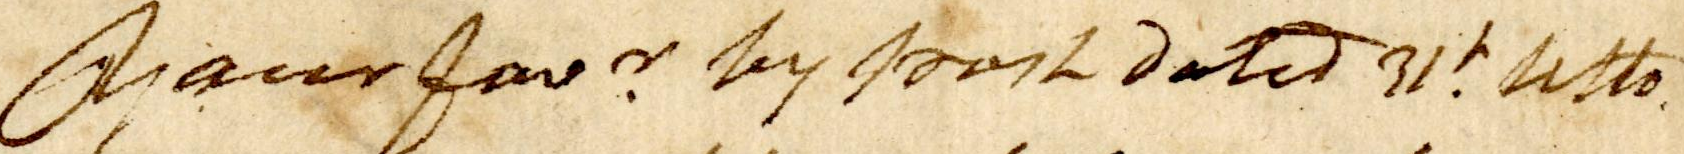Your fav^r by post dated 31^t. Ulto
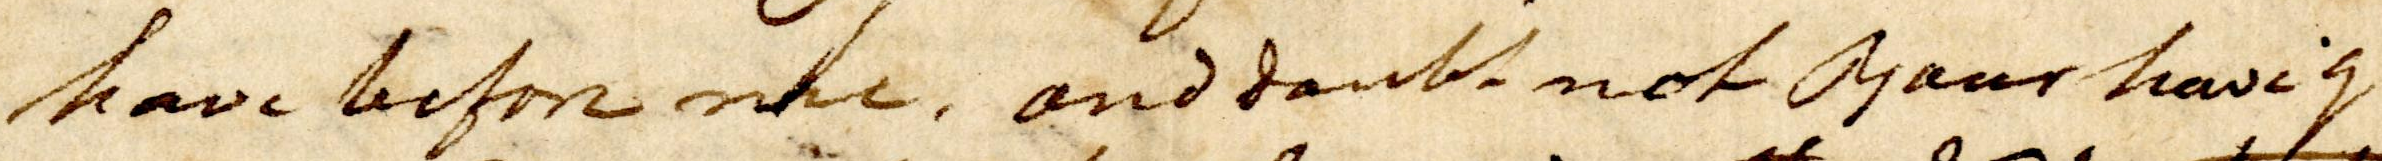have before me, and doubt not your having
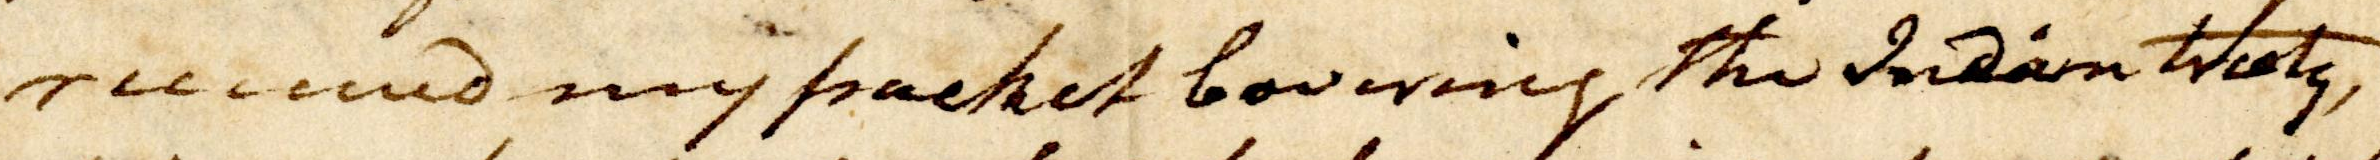received my packet covering the Indian treaty,
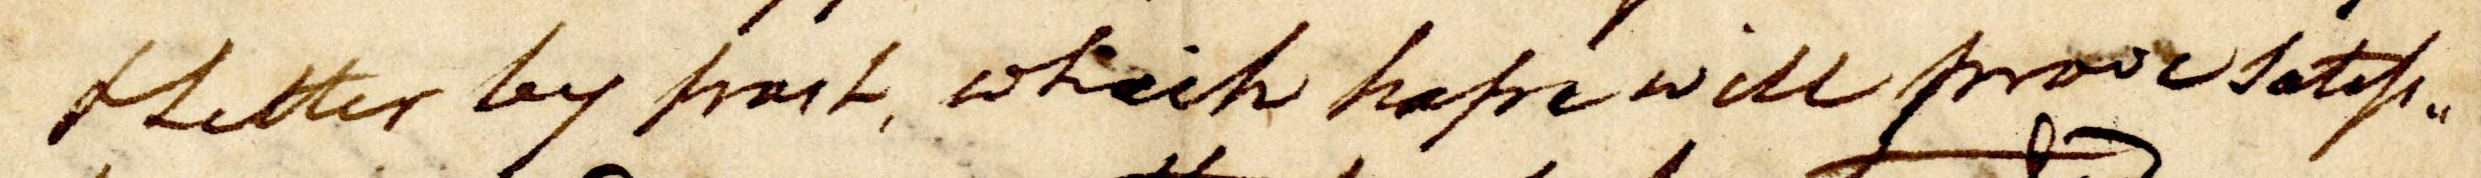& Letter by post, which hope will prove Satiss-
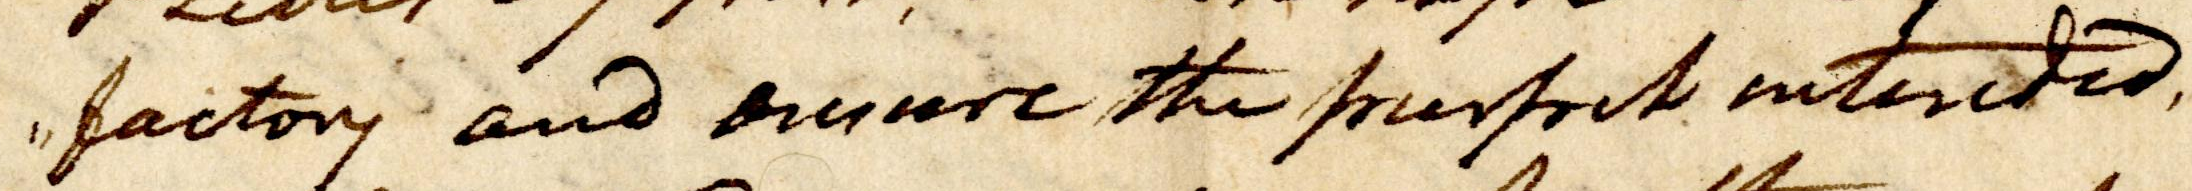-factory and insure the purpos intended
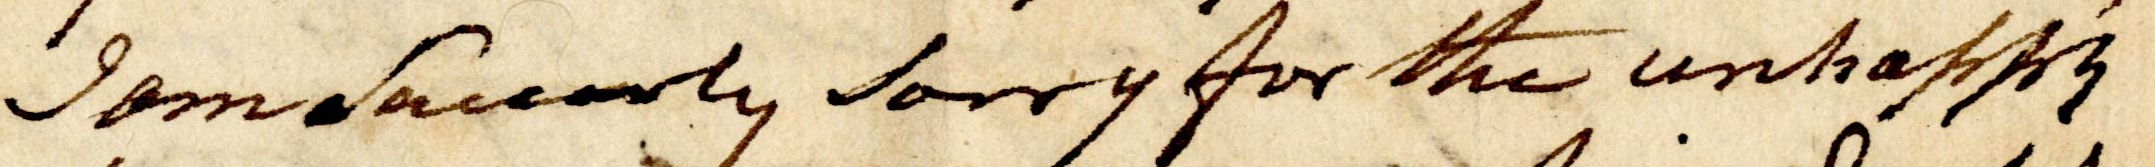I am Sincerly Sorry for the unhappy
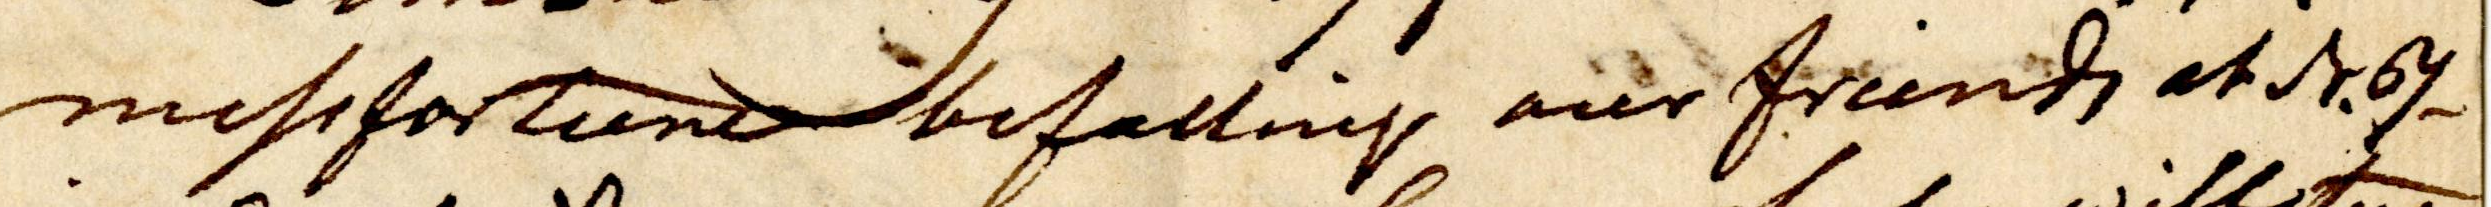misfortune befalling our friends at N.Y-
